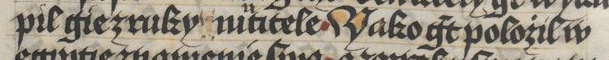pil gie zruky.niċitele.Yako ḡt položil w¬
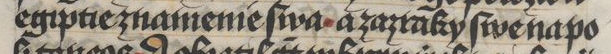egiptie znameníe ſwa.a zazraky ſwe na po¬
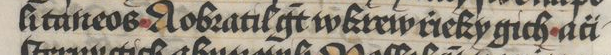li taneos.A obratil ḡt wkrew ṙieky gich.aċi¬
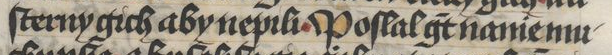ſterny gich aby nepili.Poſlal ḡt nanie mu¬
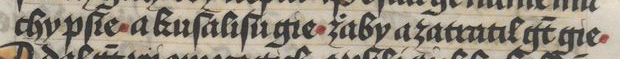chy pſie.a kuſali ſu gie.żaby a zatratil ḡt gie.
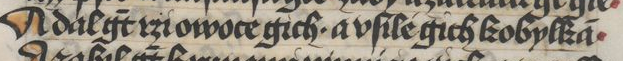A dal ḡt rzi owoce gich.a vſilé gich kobylkā.
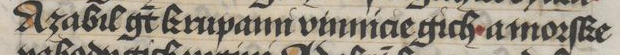A zabil ḡt krupami vinnicie gich.a morſke
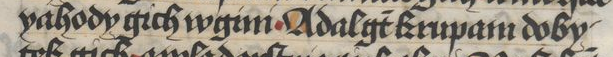yahody gich wgíní.Adal ḡt krupam doby¬
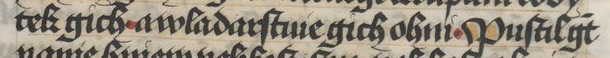tek gich.a wladarſtuie gich ohni.Puſtil ḡt
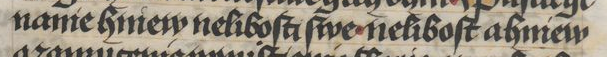nanie hniew neliboſti ſwe.neliboſt a hniew
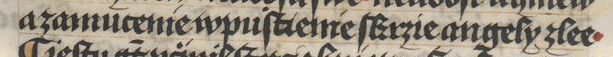a zamucenie wpuſtienie ſkrzie angely zlee.
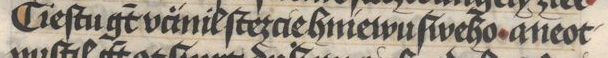Cieſtu ḡt vċinil ſtezcie hniewu ſweho.aneot¬
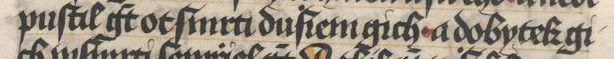puſtil ḡt otſmrti duẛiem gich.a dobytek gi¬
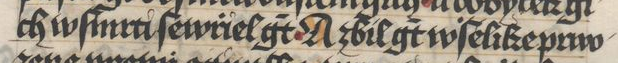ch wſmrti ſewṙiel ḡt.A zbil ḡt wẛelike prw¬
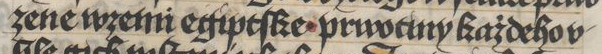zene w zemi egiptſke.Prwotiny każdeho v¬
